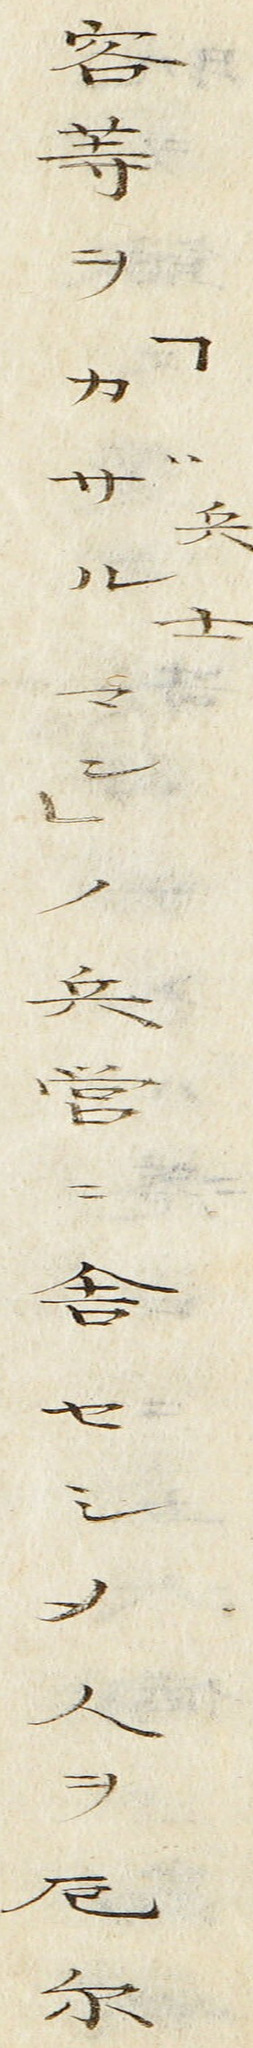客等ヲ「カザルマン」ノ兵営ニ舎セシメ人ヲ厄尓
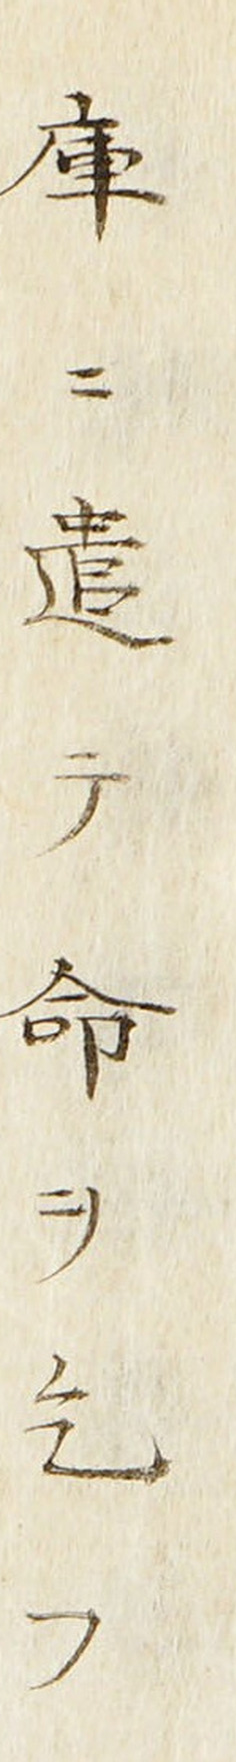庫ニ遣テ命ヲ乞フ
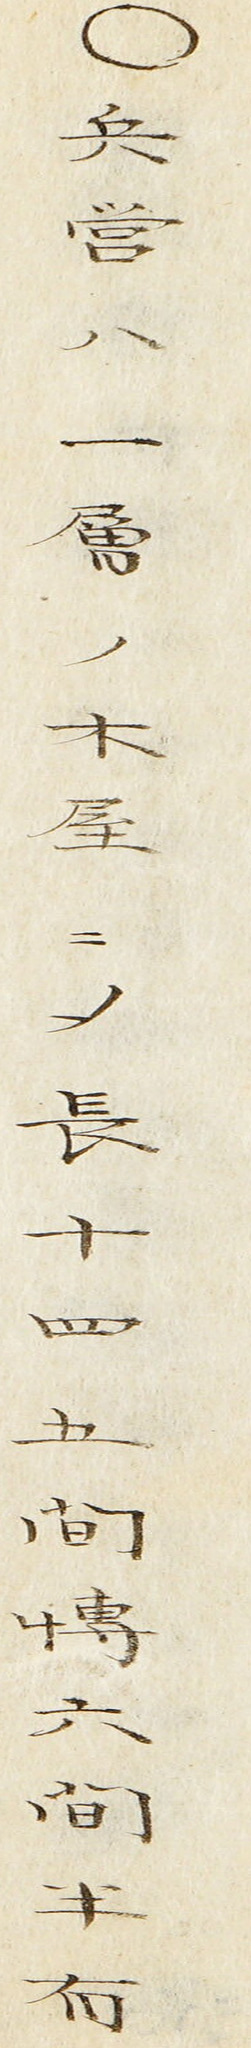〇兵営ハ一層ノ木屋ニシテ長十四五間博六間半有
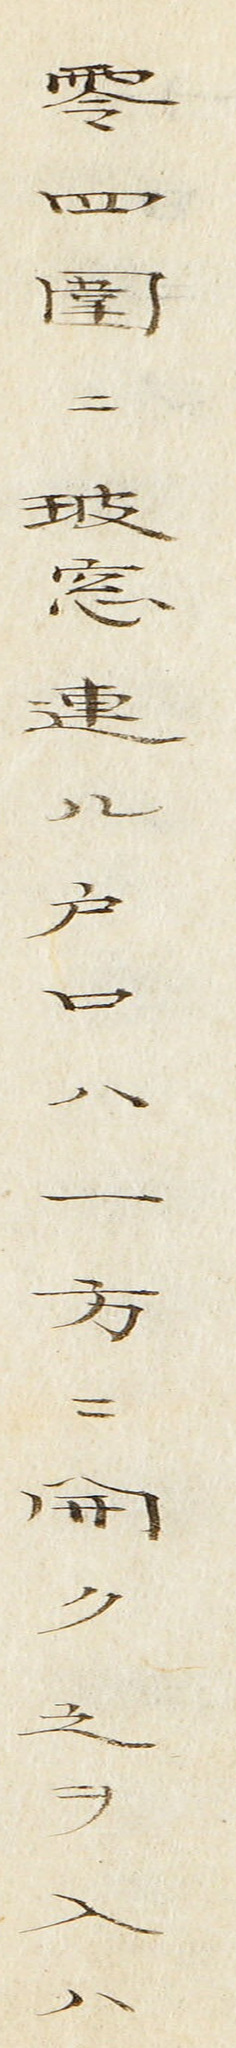零四囲ニ玻窓連ル戸口ハ一方ニ開ク之ヲ入ハ
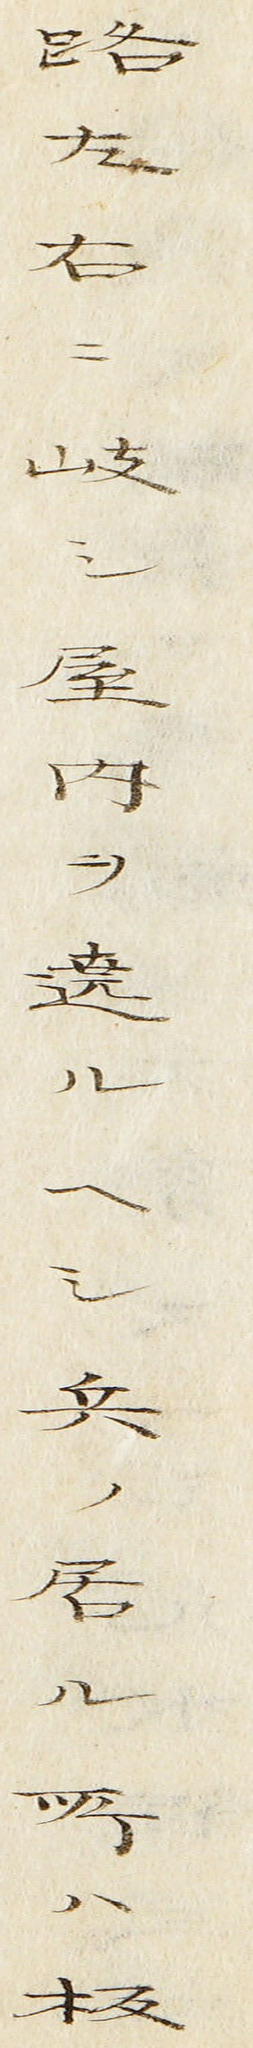路左右ニ岐シ屋内ヲ遶ルヘシ兵ノ居ル所ハ板
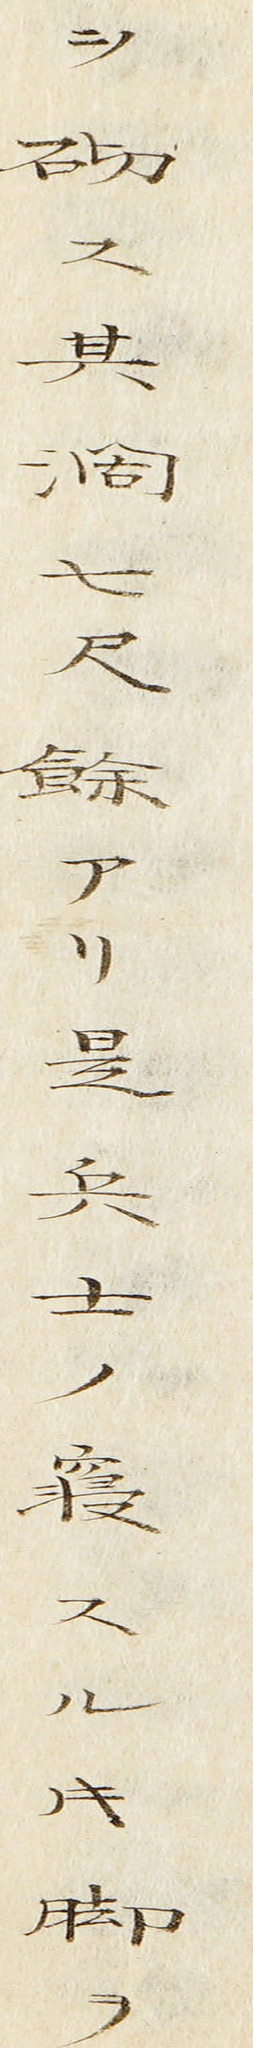ヲ砌ス其濶七尺余アリ是兵士ノ寝スルトモ脚ヲ
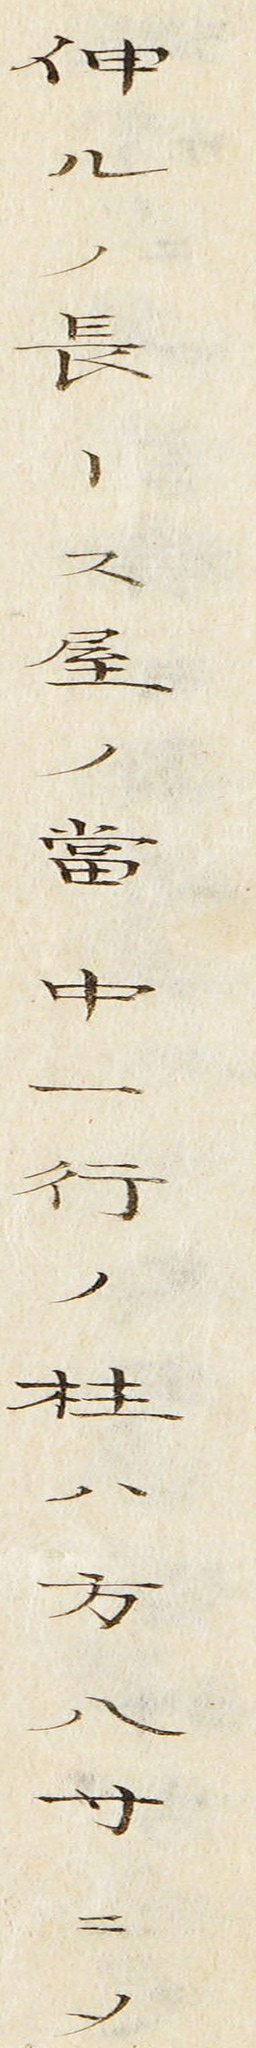伸ルノ長ト？ス屋ノ当中一行ノ柱ハ方八寸ニシテ
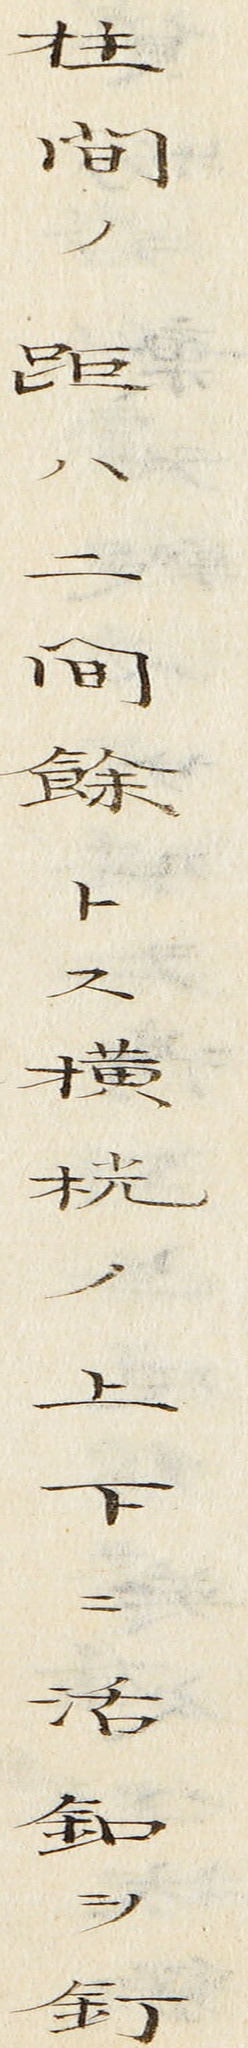柱間ノ距ハニ間余トス横桄ノ上下ニ活釦ヲ釘
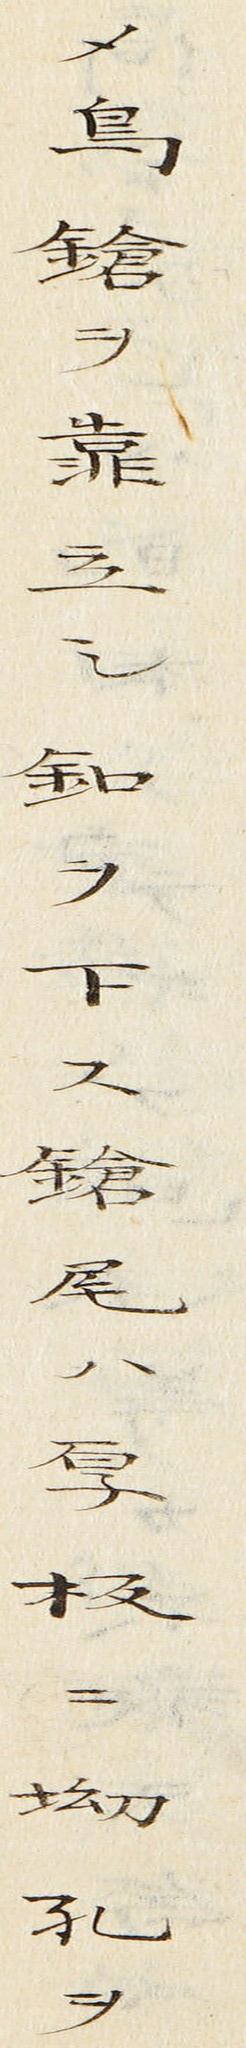シテ鳥鎗ヲ靠立シ釦ヲ下ス鎗尾ハ厚板ニ坳孔ヲ
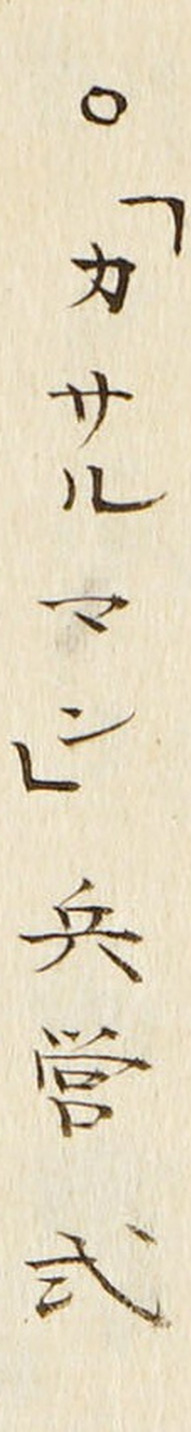〇「カサルマン」兵営式
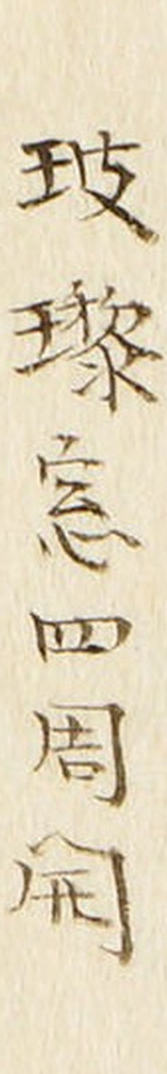玻瓈窓四周開
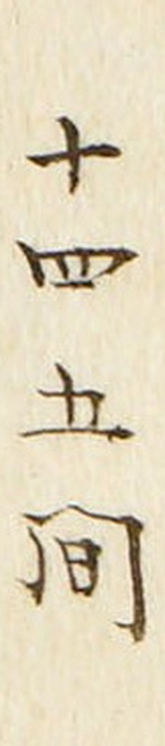十四五間

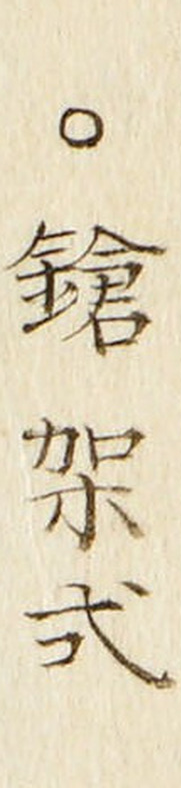〇鎗架式
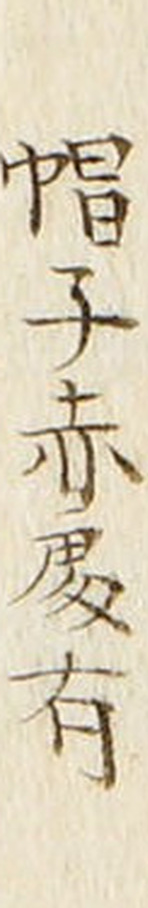帽子赤房有
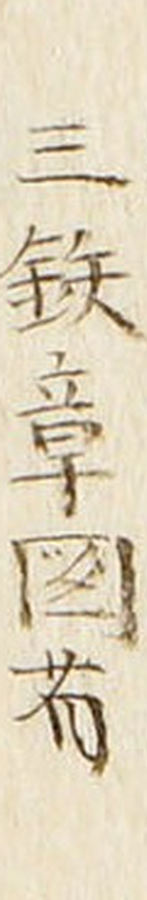三鉄章図有
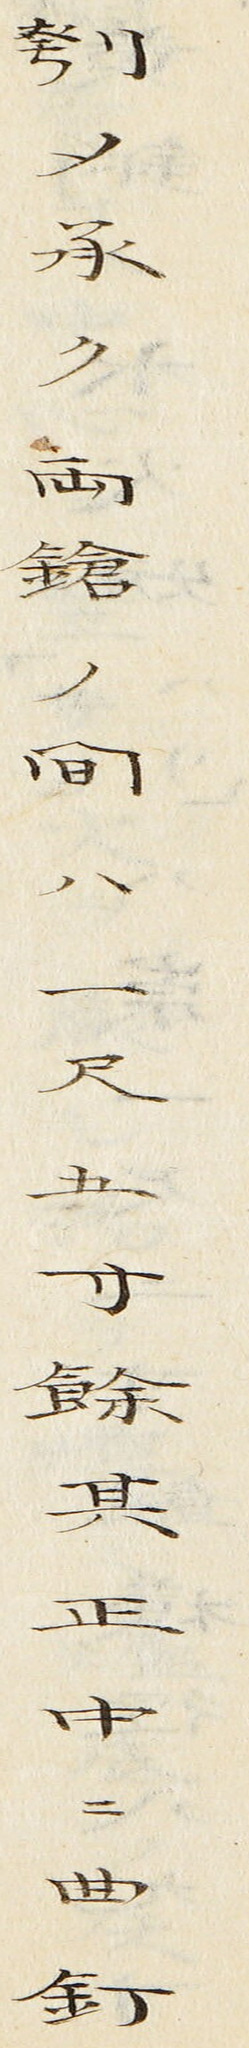刳シテ承ク両鎗ノ間ハ一尺五寸余其正中ニ曲釘
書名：蕃談
